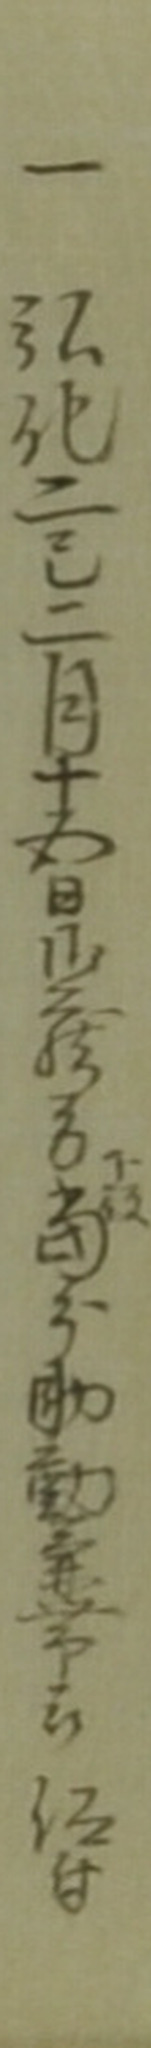一弘化二巳二月十五日御蔵方当分助勤兼帯被仰付
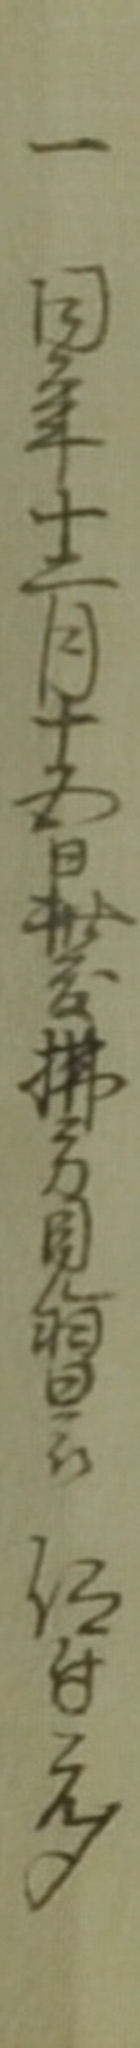一同年十二月十五日此度払方見習被仰付元〆
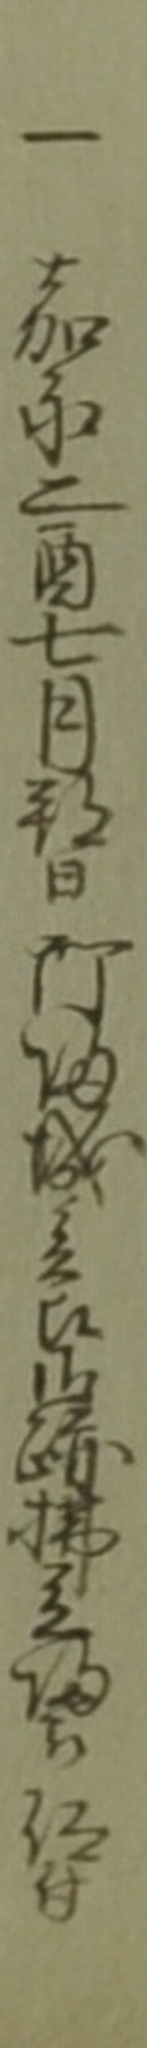一嘉永二酉七月朔日御帰城之節御跡払立帰被仰付
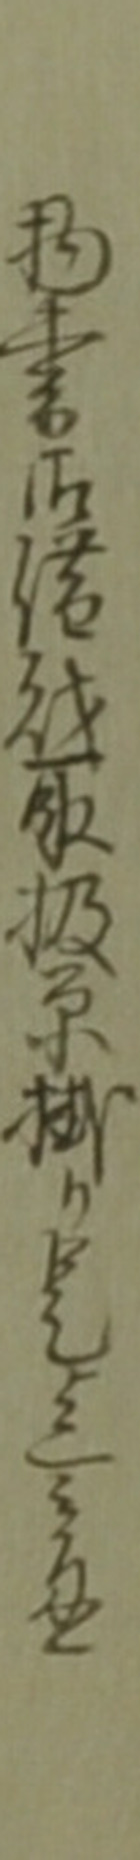物書御借財取扱原掛リ是迄之通
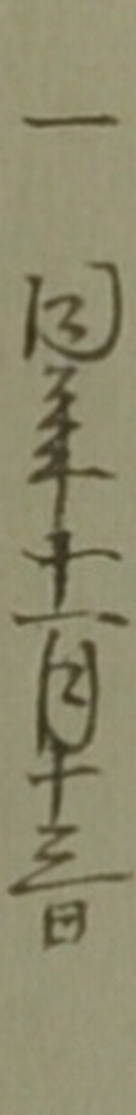一同年十一月十三日

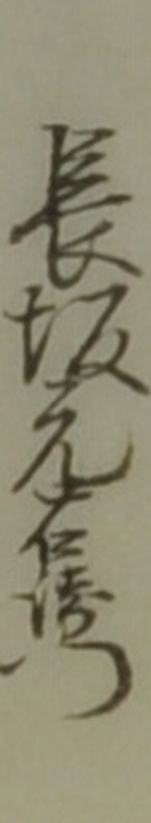長坂元右衛門
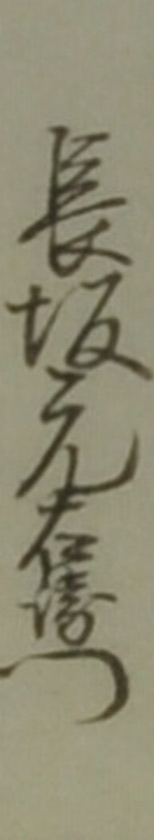長坂元右衛門
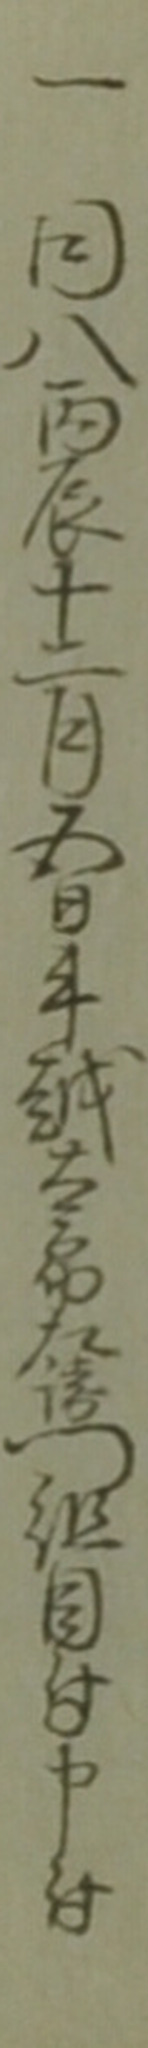一同八丙辰十二月五日手紙太郎左衛門組目付申付
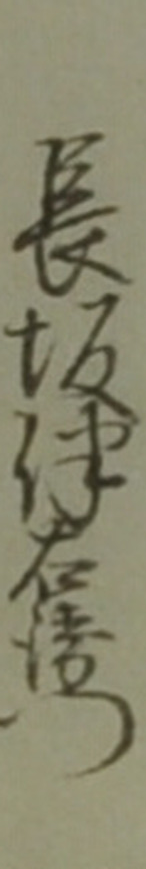長坂伴右衛門
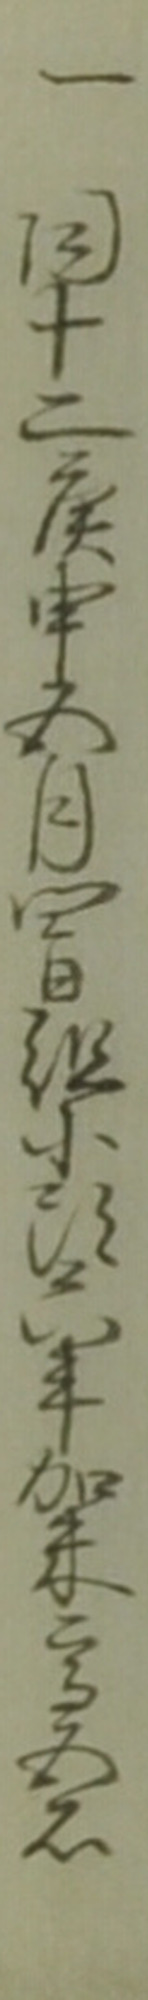一同十二庚申五月四日組小頭六年加米高五石

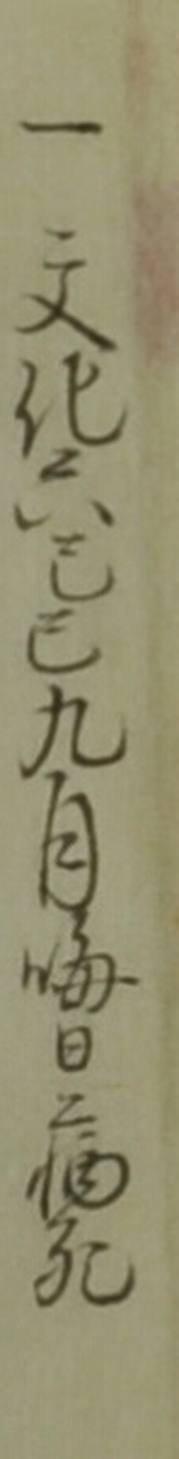一文化六己巳九月晦日病死
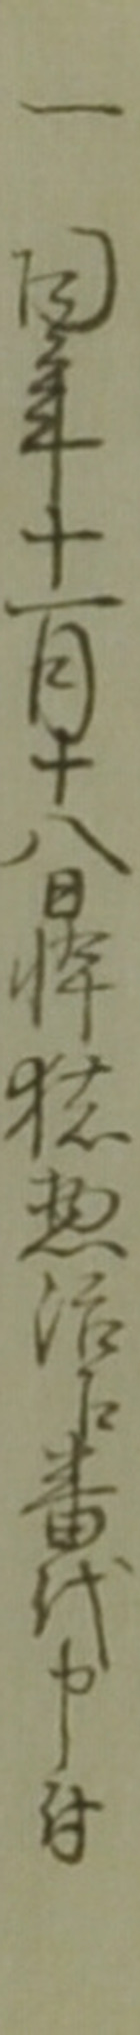一同年十一月十八日忰猪惣治江番代申付
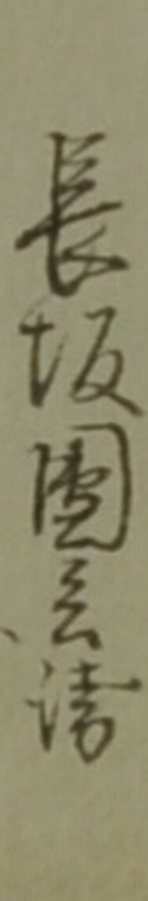長坂團兵衛
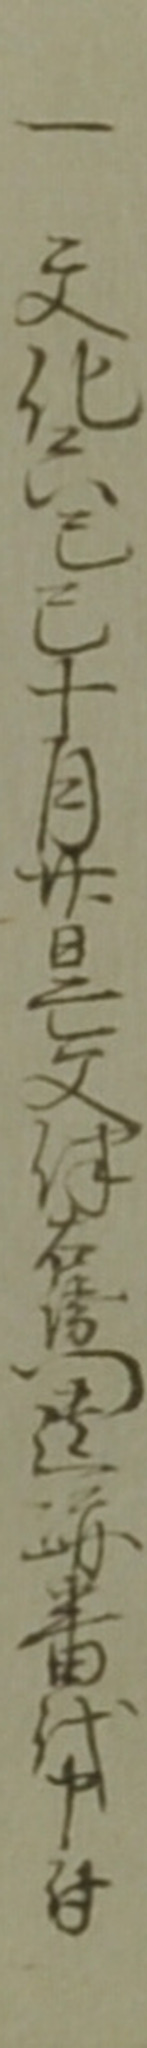一文化六己巳十月廿日亡父伴右衛門遺跡番代申付
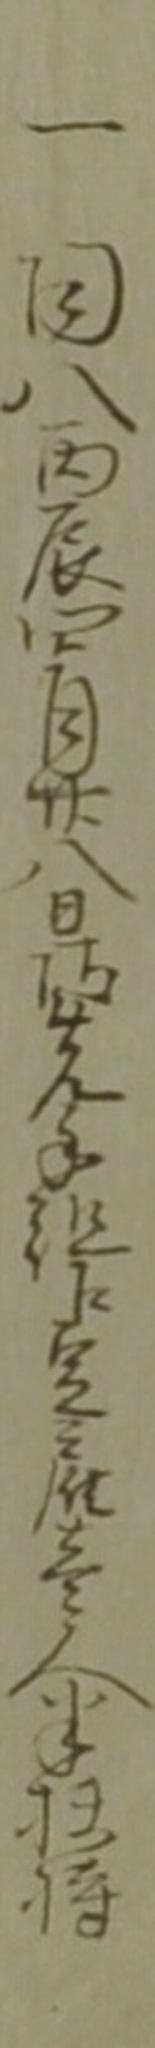一同八丙辰四月廿八日御先手組江定雇壱人半扶持
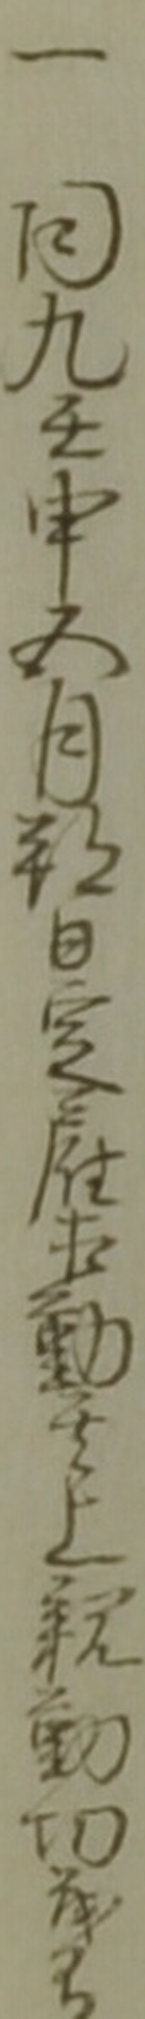一同九壬申五月朔日定雇相勤其上親勤切茂有
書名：無足諸士勤仕録（八）
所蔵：伊那市立高遠町図書館・合同会社AMANE
